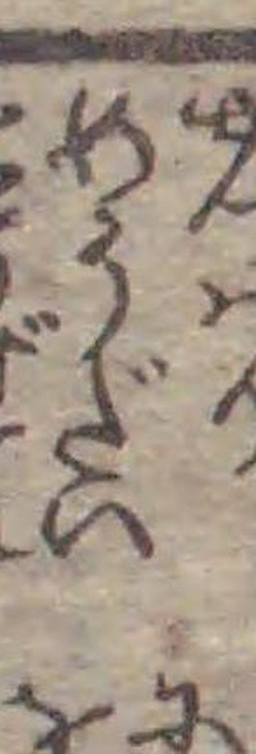めいだい
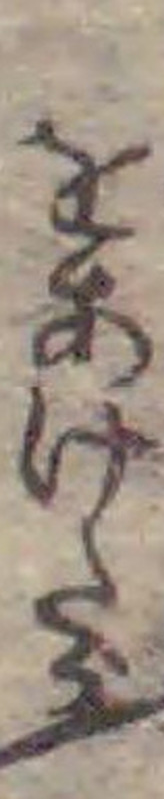をあけたら
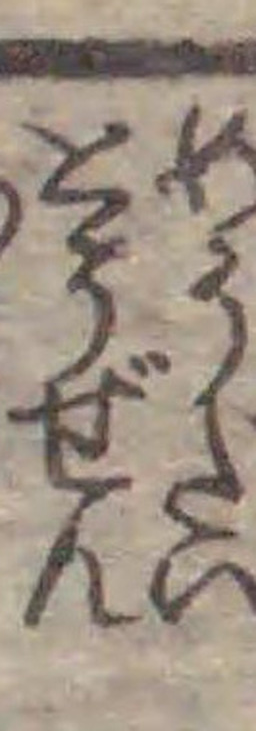とうぜん
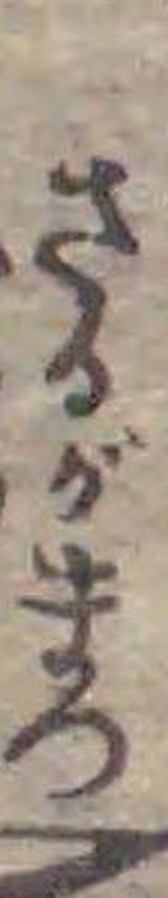さるがまつ
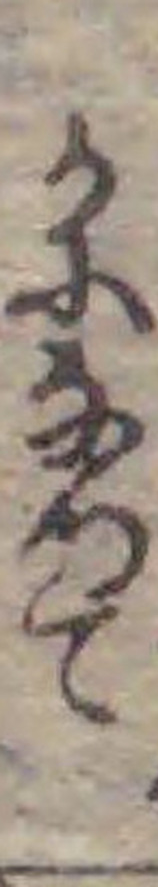かになつて
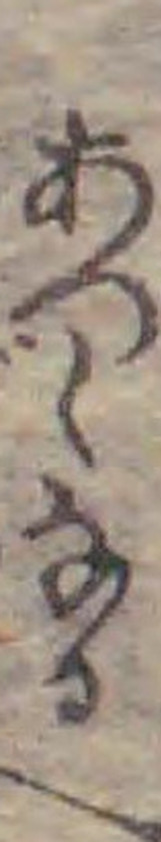あつくなる
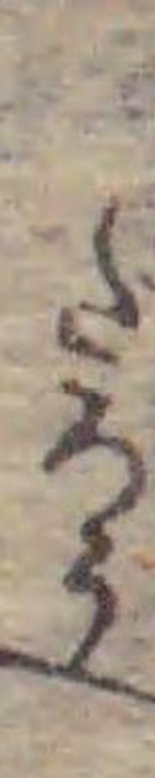だろう

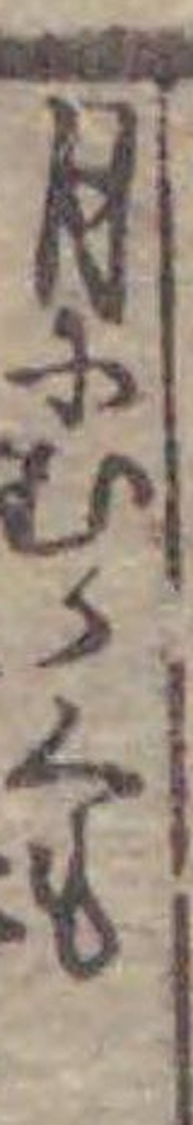月にむらくも
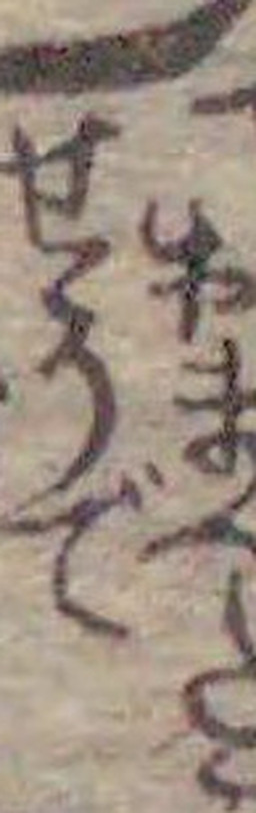せうで
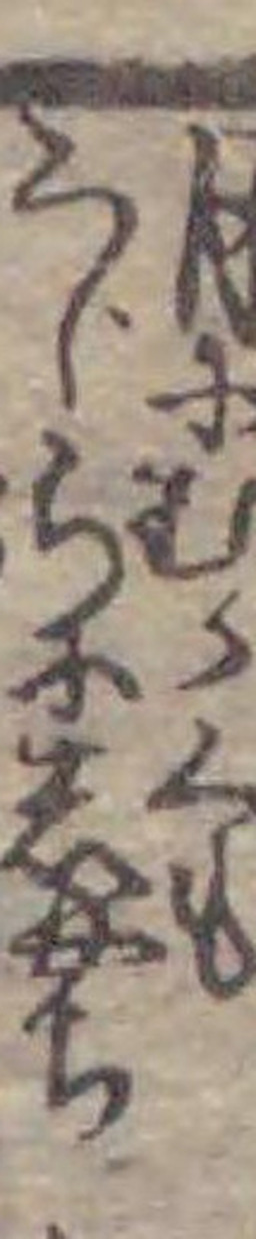くじらにしやち
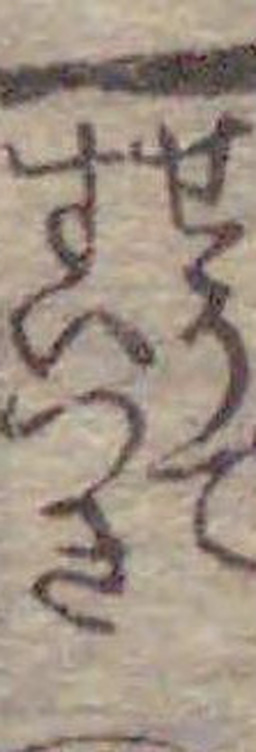すいつき
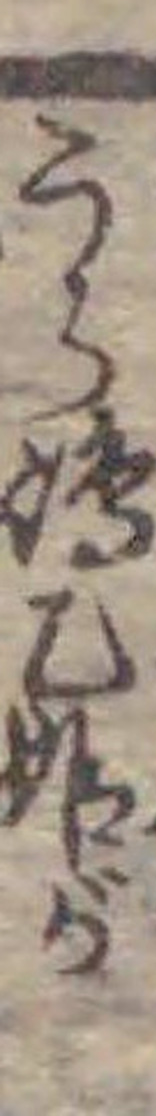うら島乙姫が
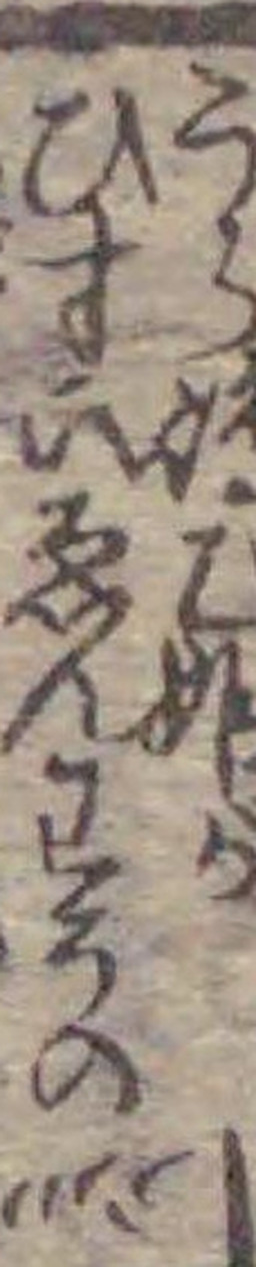ひすいゑんわうの
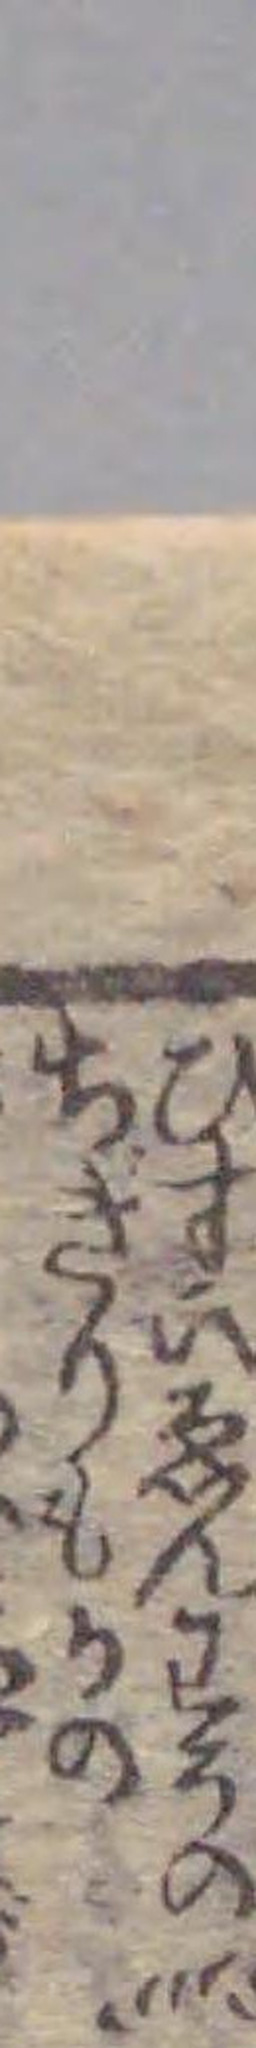ちぎりもかの
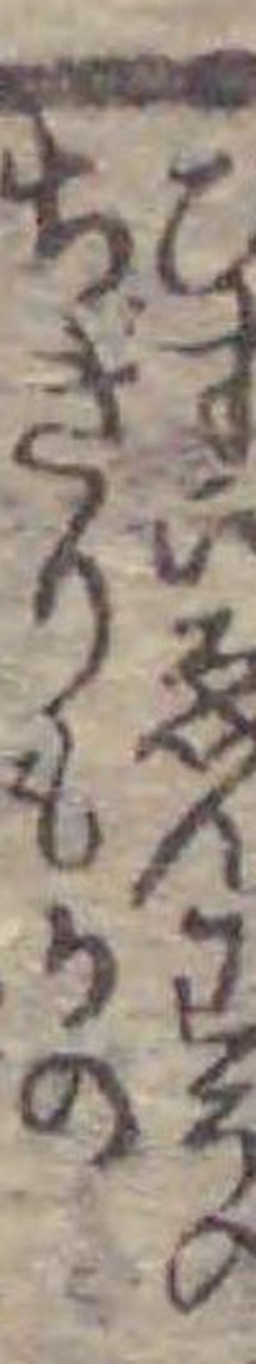ちぎりもかの
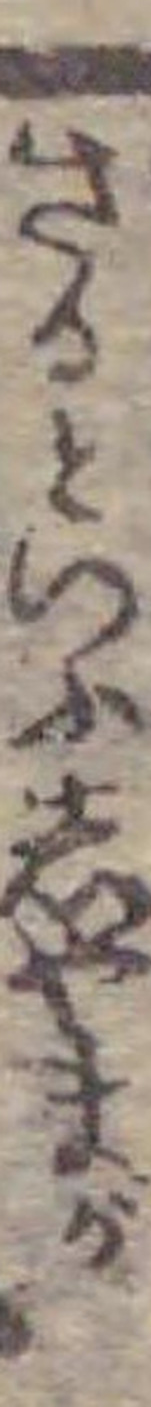さるといふしやまが
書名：竜宮苦界玉手箱 : 3巻
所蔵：国立国会図書館 National Diet Library, JAPAN
